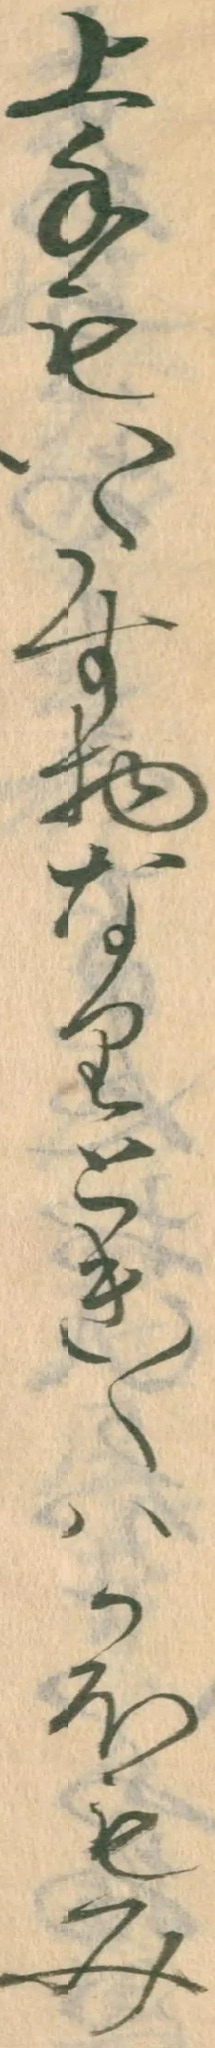上手もいたす物なりとき〳〵はかほもみ
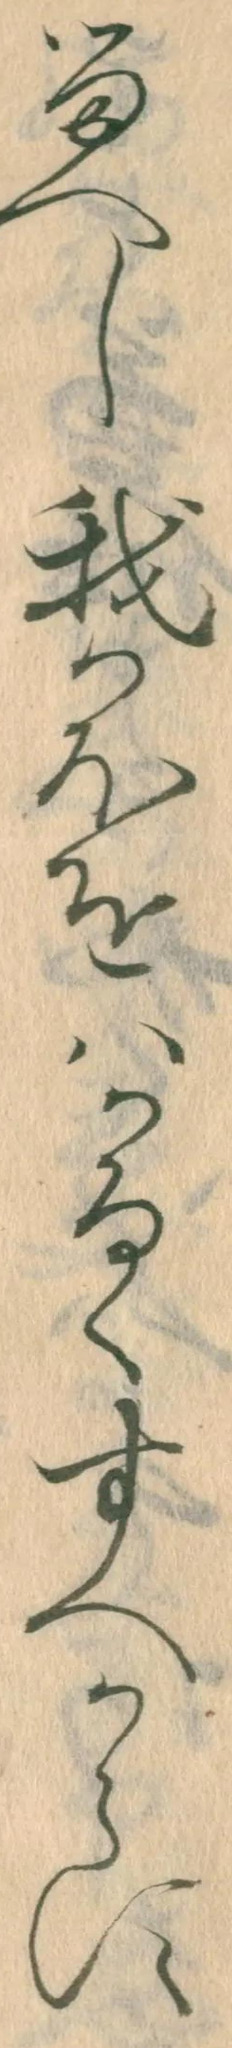るへし我かほをはかるくすへからす
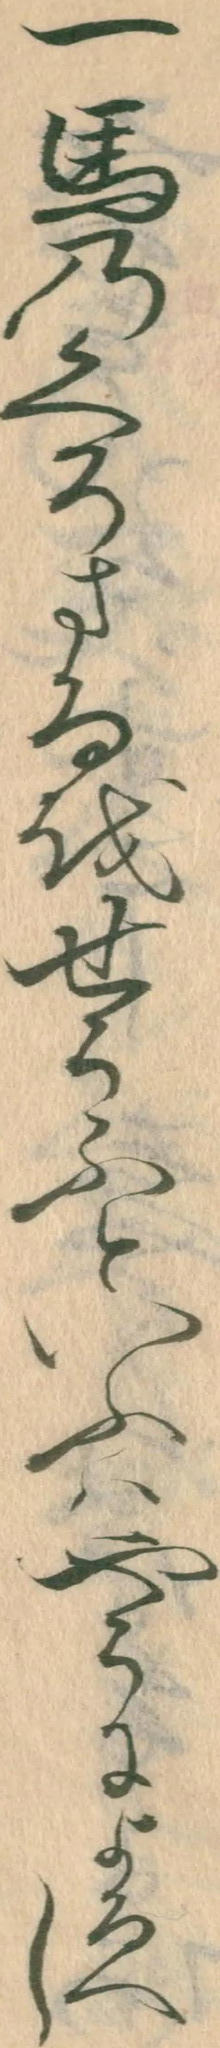一馬のくそまるをせうふといふはやうによるへし
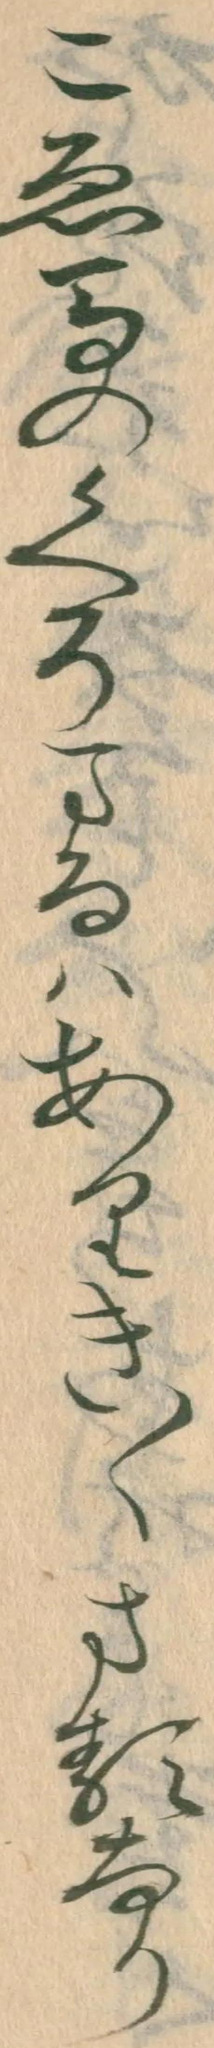こゑ馬のくそまるはありき〳〵まるなり
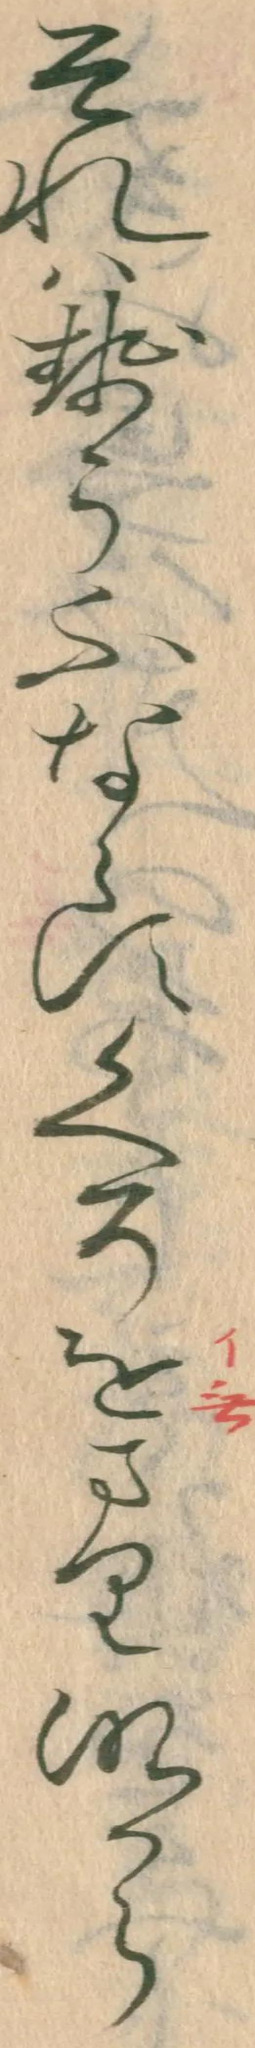それはせうふならすくそをまりなから
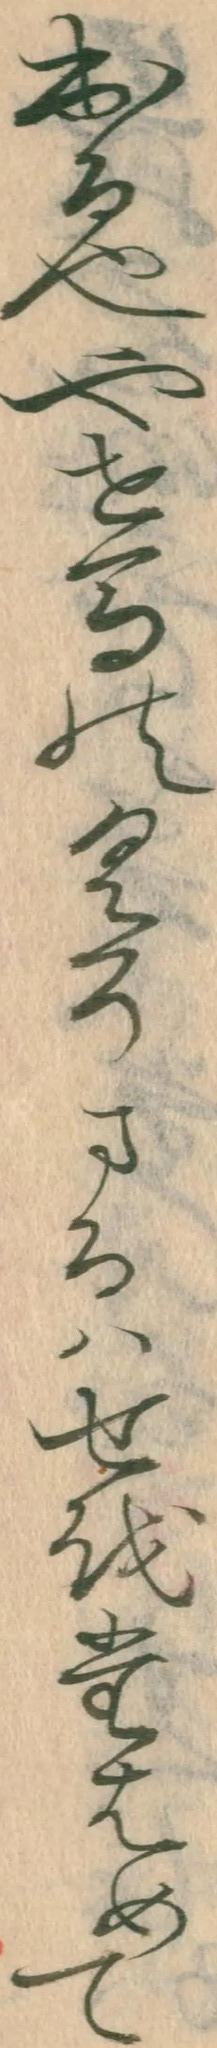出る也やせ馬のくそまるはせをたはめて
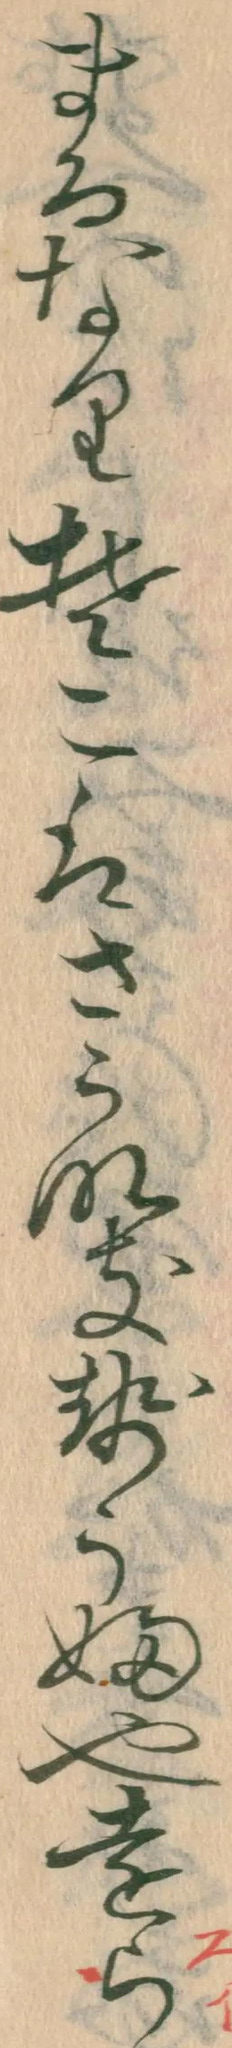まるなりそこはさうなきせうふ也をら
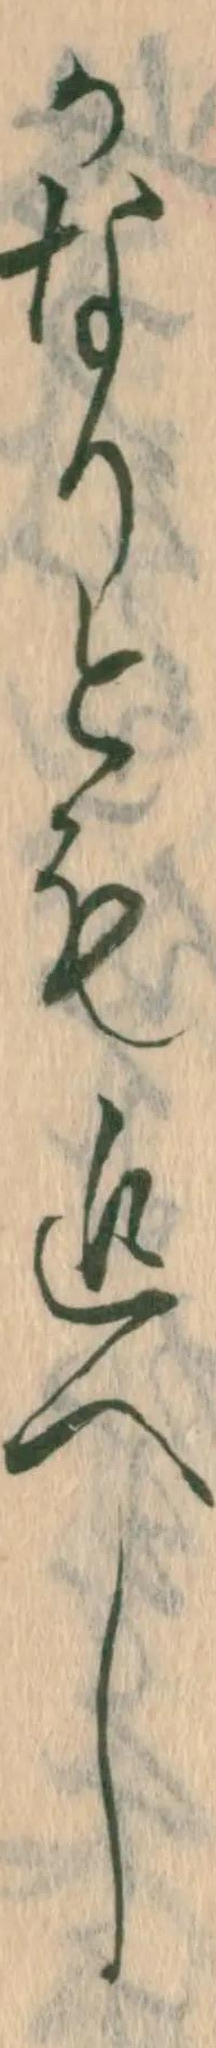かなりとも追へし
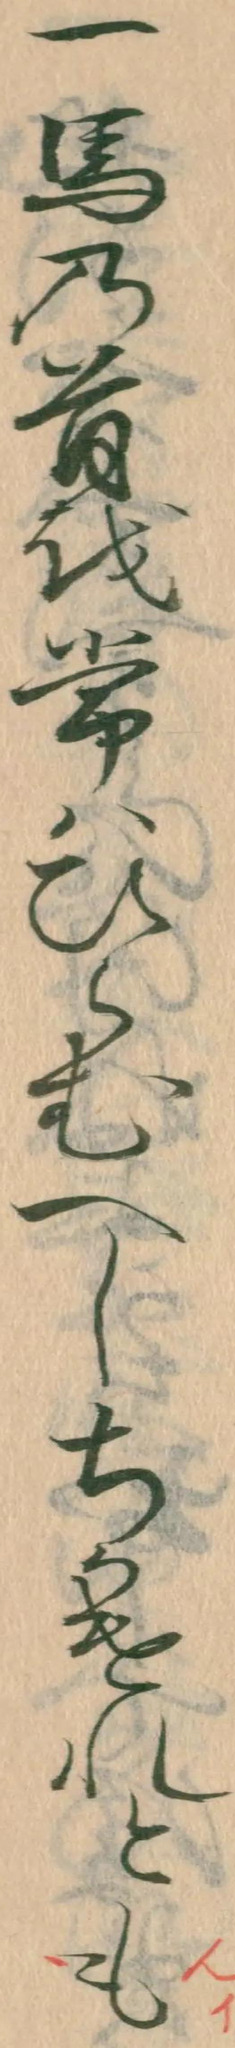一馬の首を常はひらむへしちかけれとも
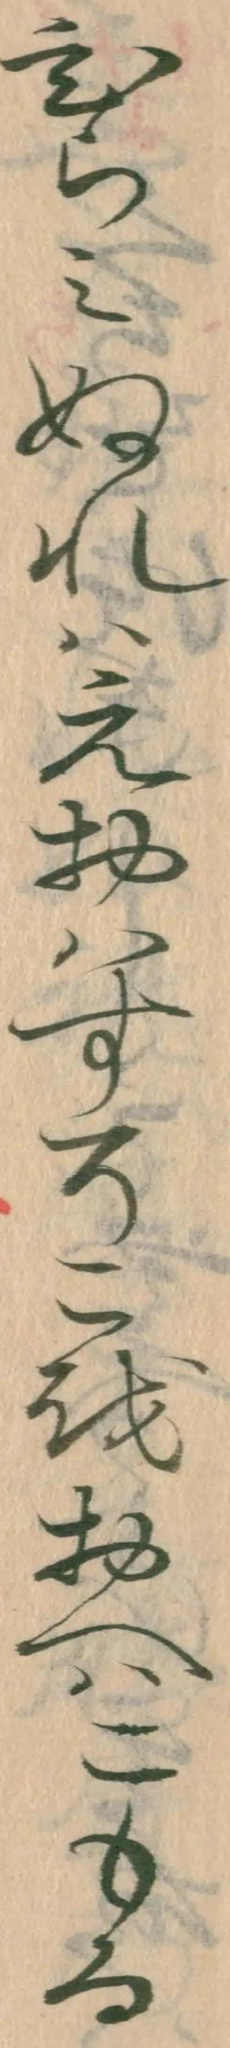ひらみぬれはえおはすそこをおへはこもる
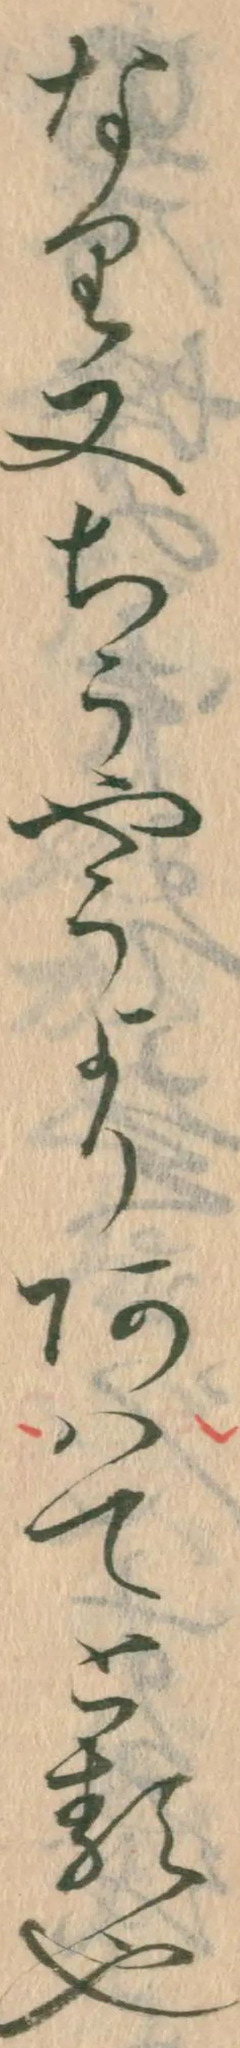なり又ちうやうよりあはてとる也
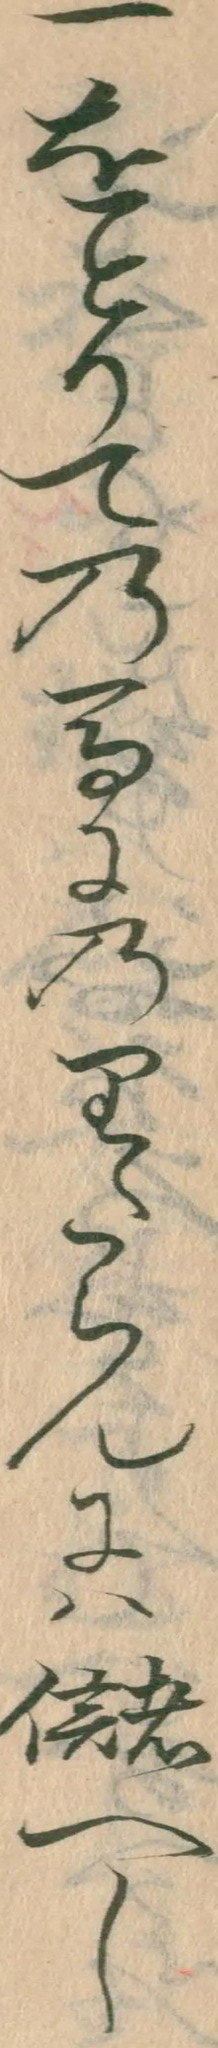一をとりての馬にのりたらんには儲へし
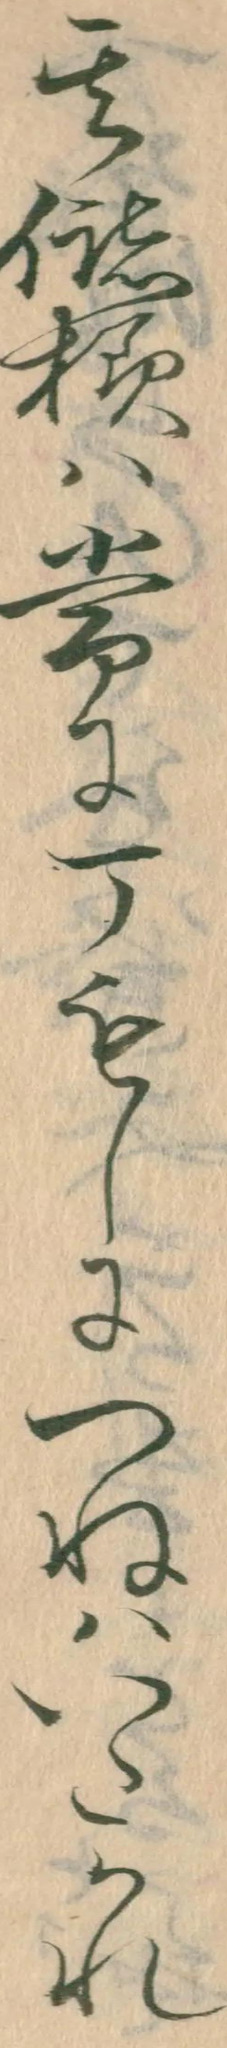其儲様は常に丁もしにつねはいたかれ
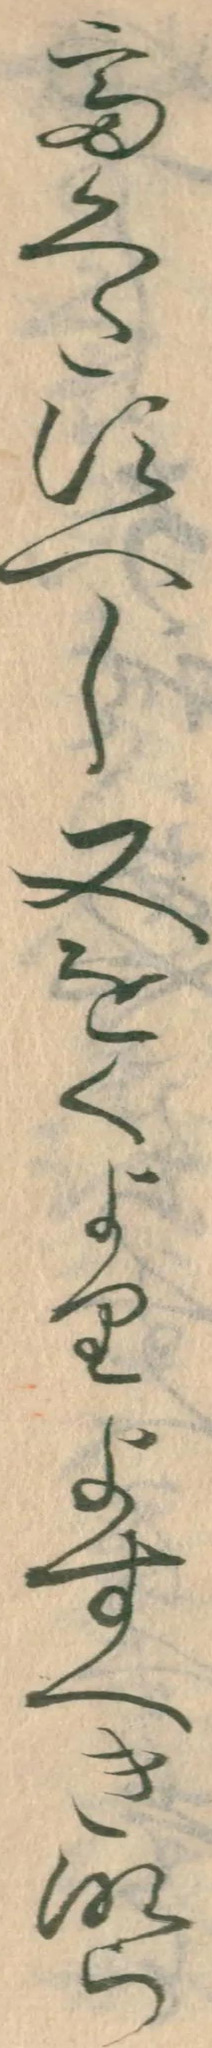てくたすへし又をくよりよすへきなら
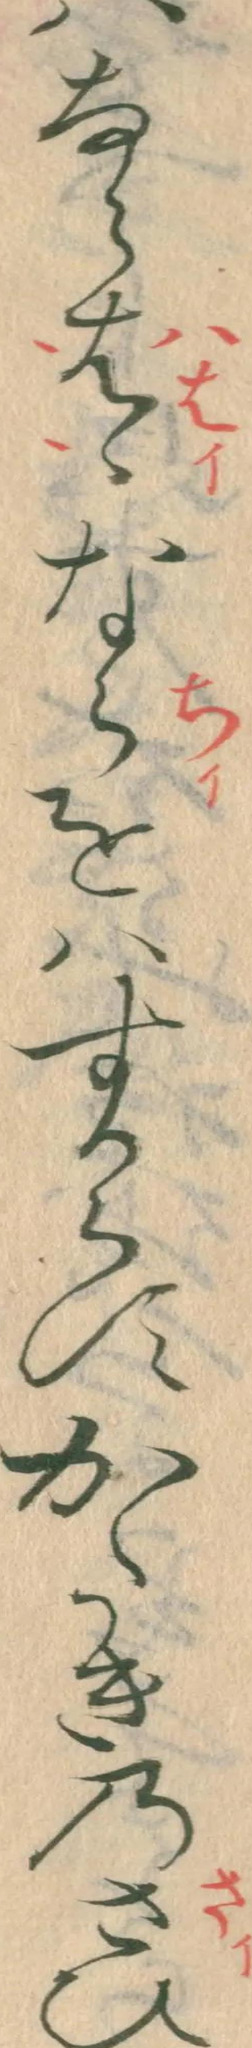はならはゝならをはすからすかたきのさひ
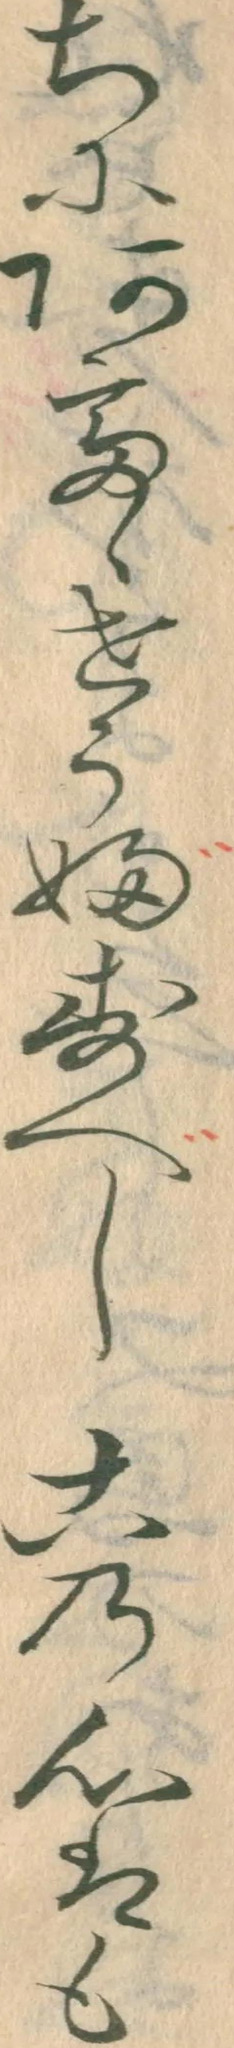ちにあてゝせうぶすべしこの心はも
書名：賀茂社記録. 第13冊
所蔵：国立国会図書館 National Diet Library, JAPAN
